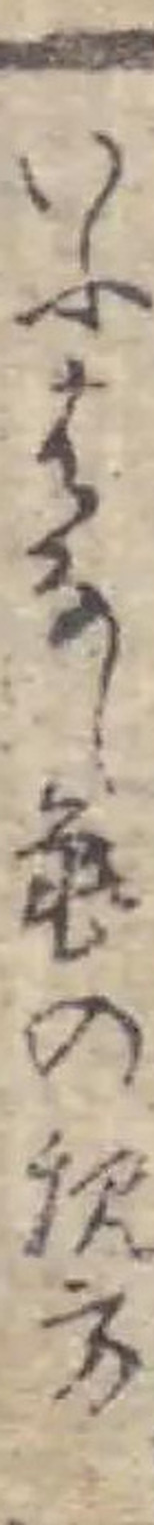いふはなし亀の親方
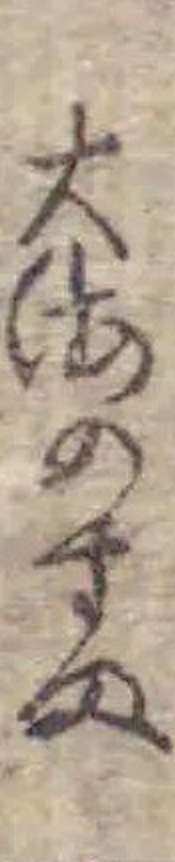大海のすま
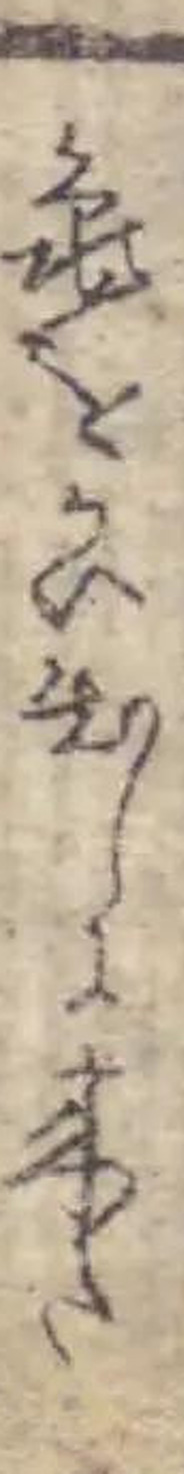亀をかい出しに来た
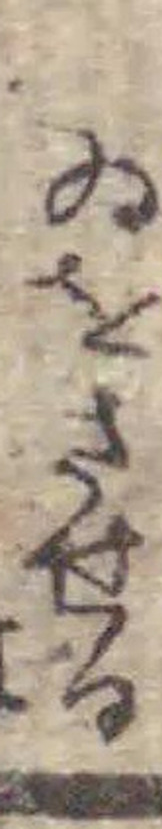ゐをさせる
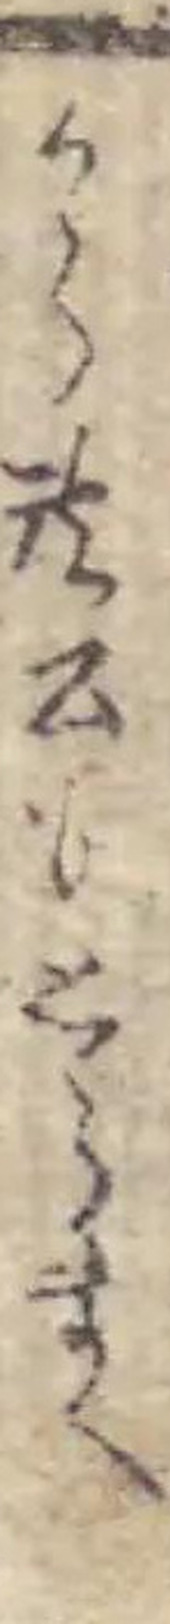から貴公もとらまへ
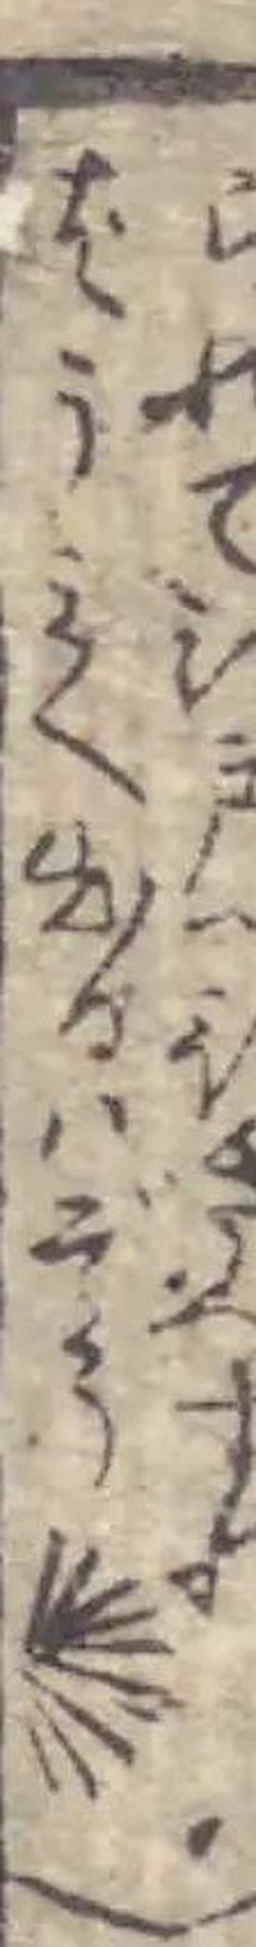ばうみへ出るはぞう
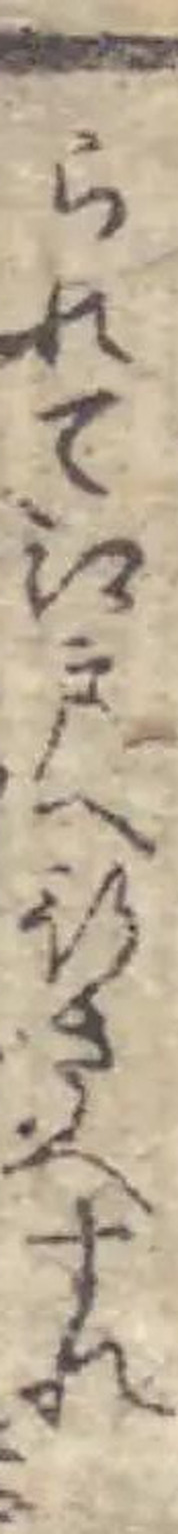られて江戸へ行さへすれ
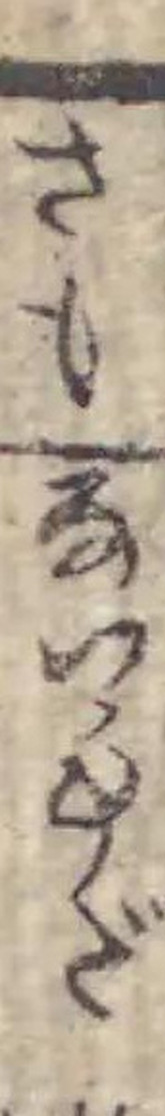さもない事だ
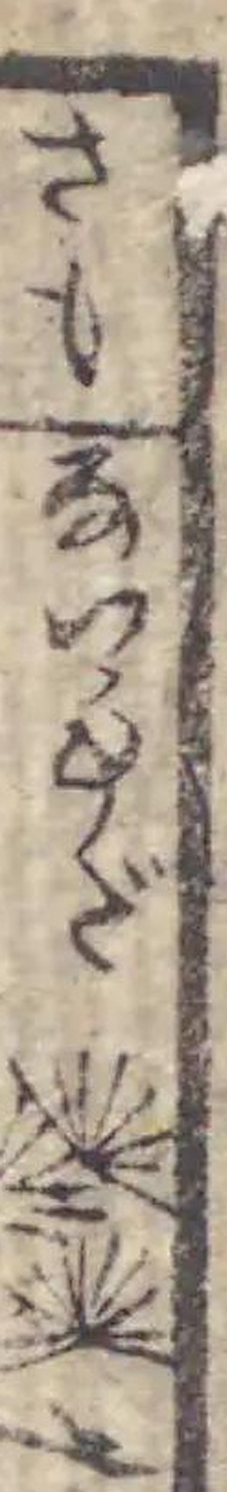さもない事だ
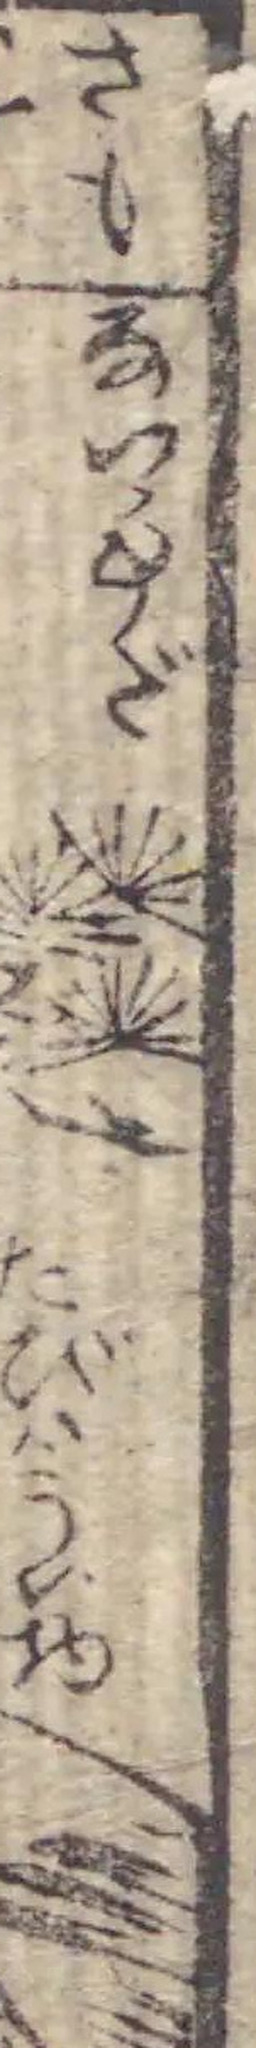さもない事だ
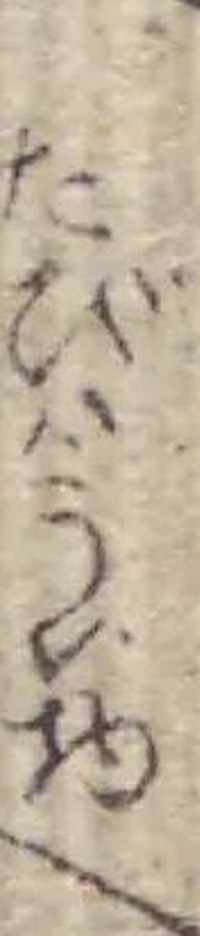たびはうい物
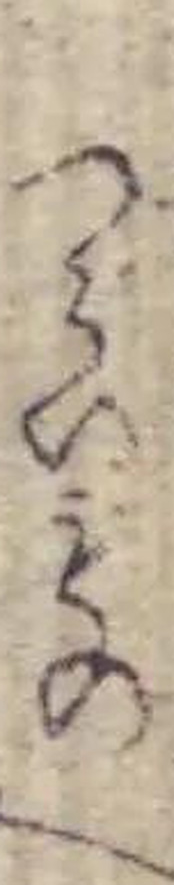つらいもの
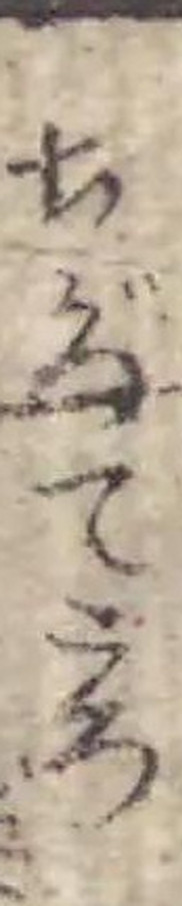ちがつてころ
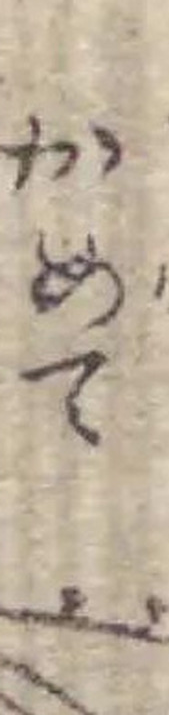かめて
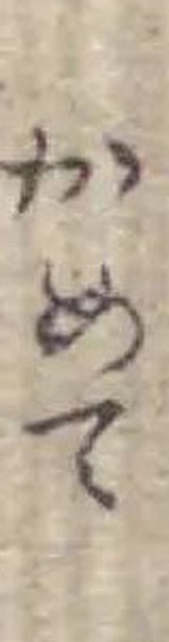かめて
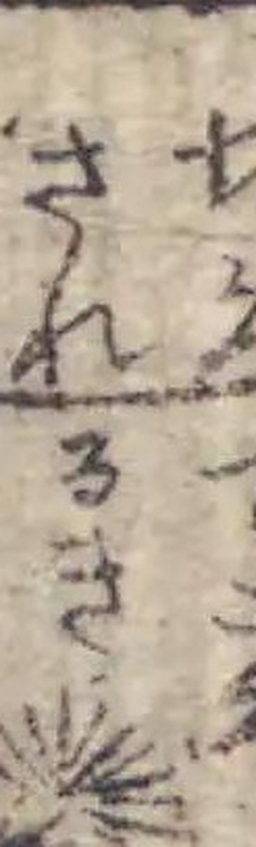されるき
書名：見立蓬莱 : 2巻
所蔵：国立国会図書館 National Diet Library, JAPAN
